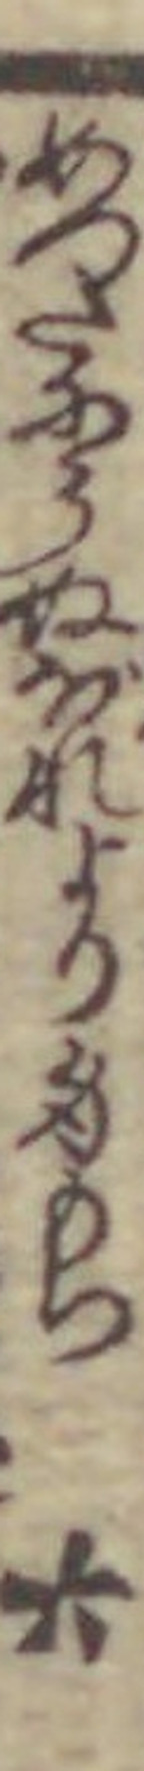めつたにうぬぼれより身もち
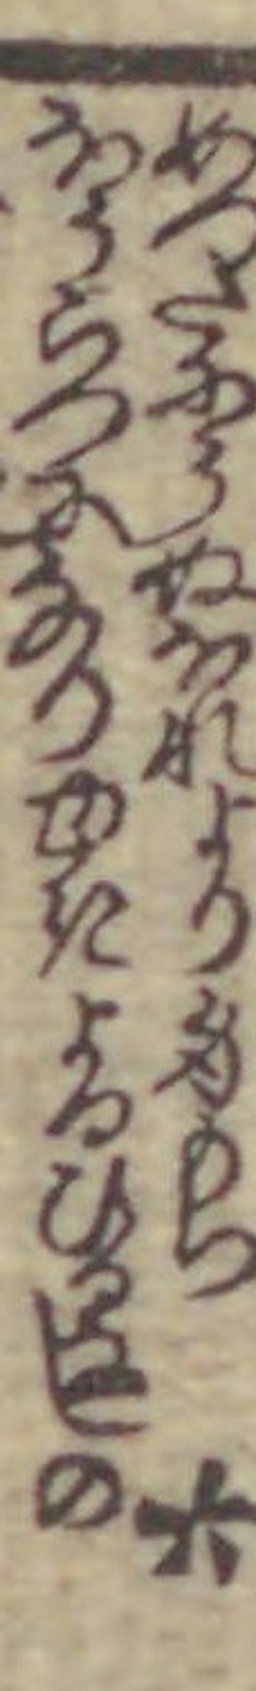ほうらつになりゆきよるひるなしの
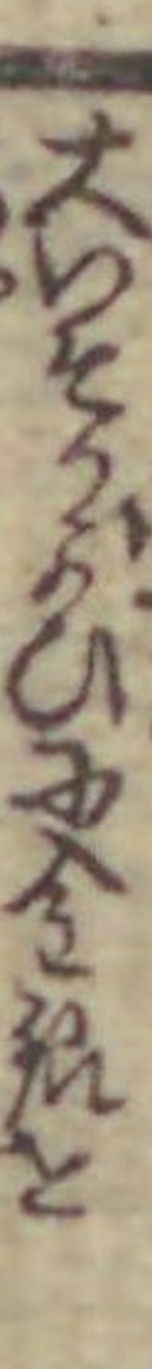大いそかよひに金銀を
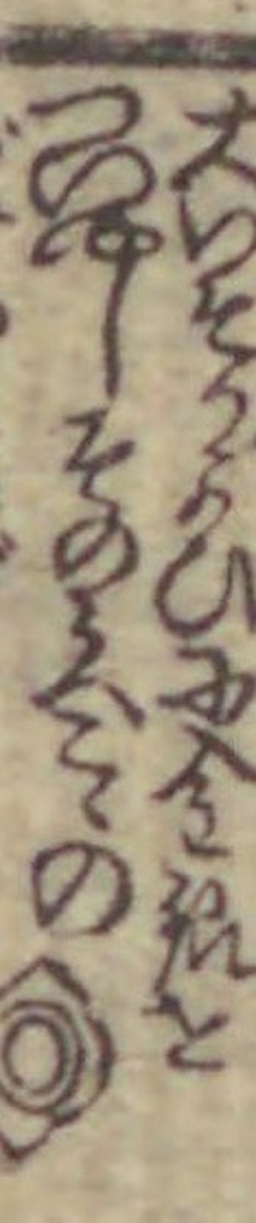ついやしそのうへこゝの
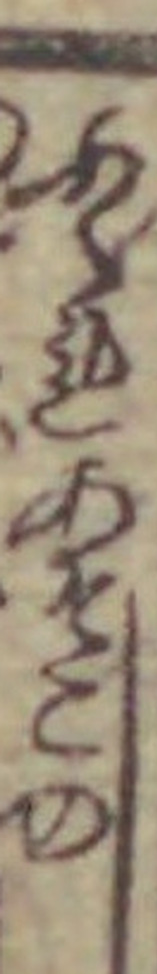ふくれあそこの
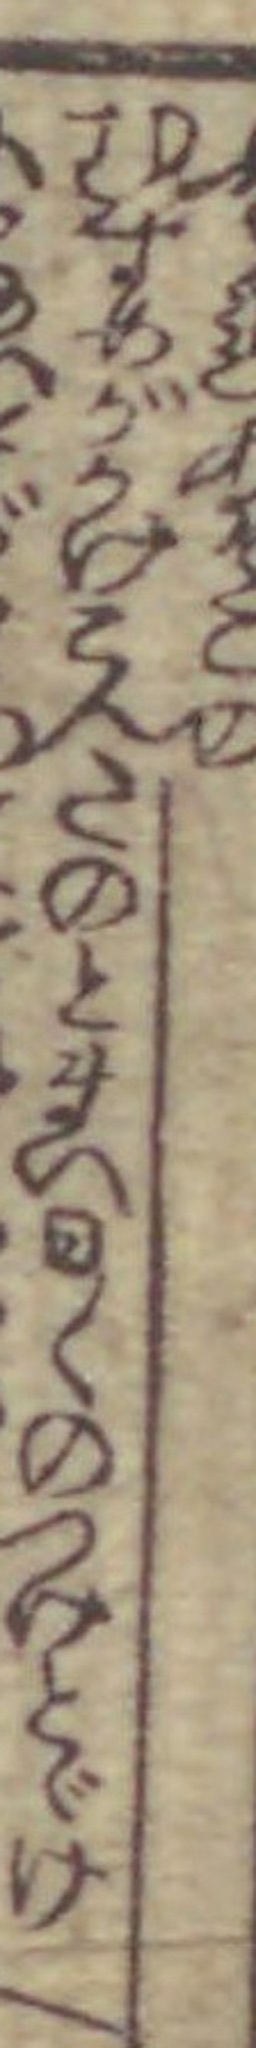むすめがかけこんたのとまい日〳〵のつけとゞけ
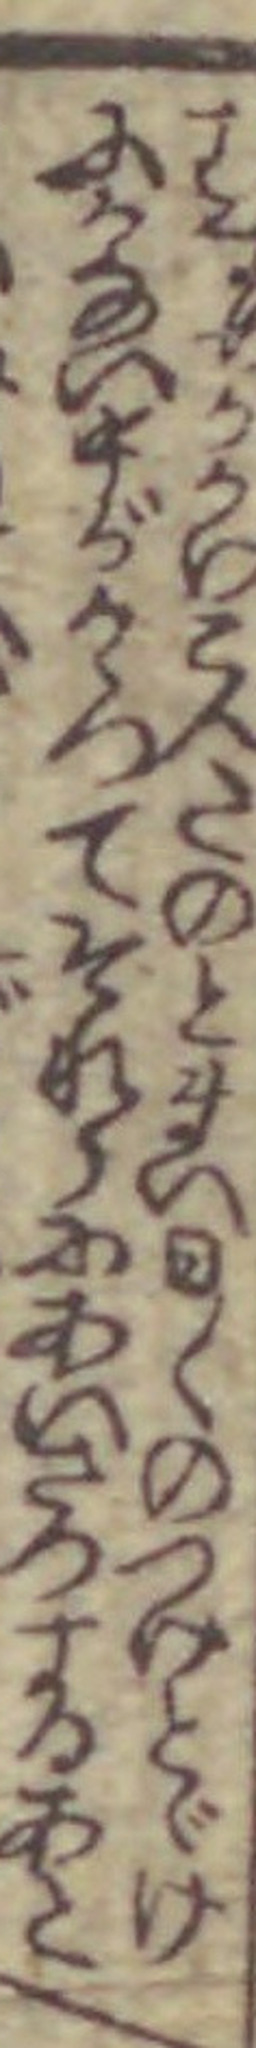にかない中がかゝつてそれらにあいさつするあと
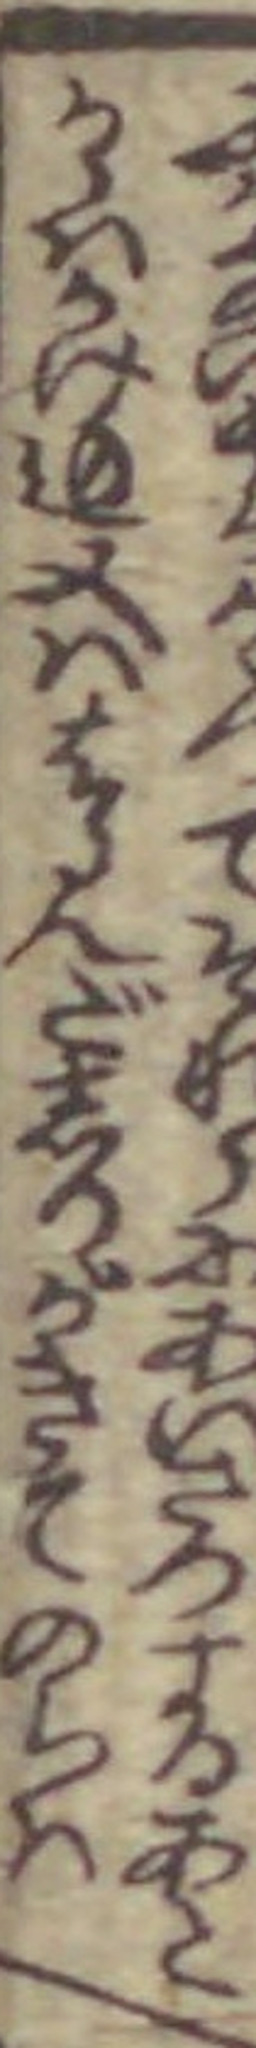からはかけ込又ははらんだしりがきてのちは
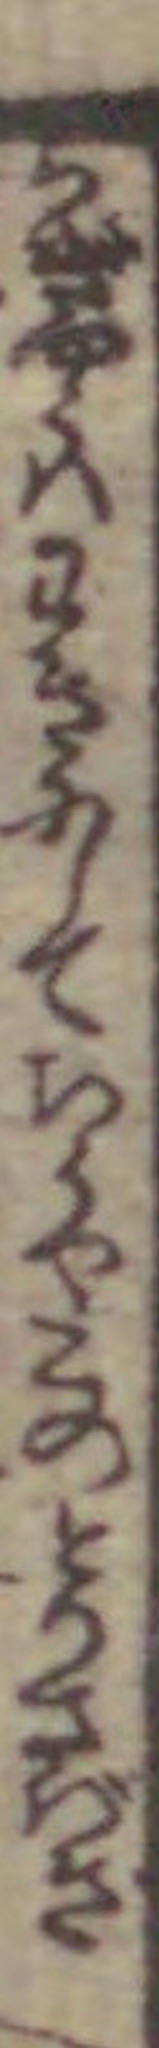かぎやうはわきにしてちうやこのとりさはぎ
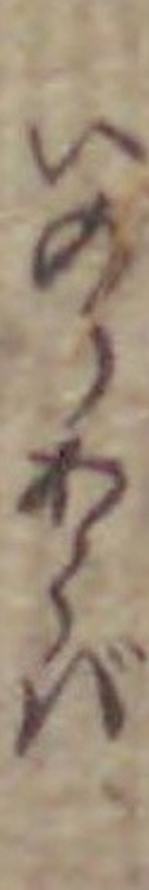いのりあらば
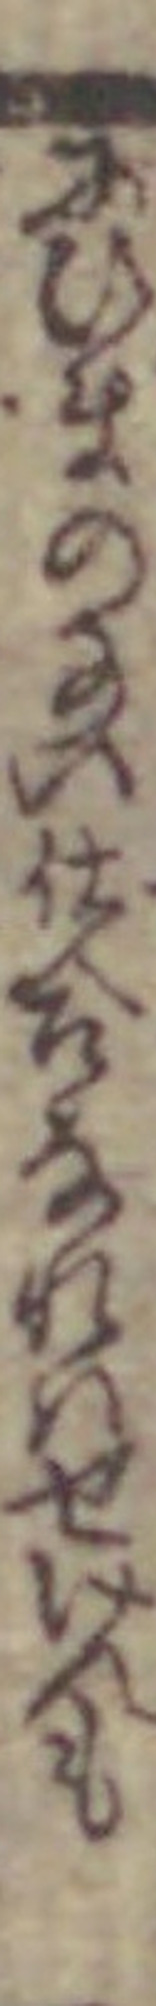にひまのない仕合なれはせけんも
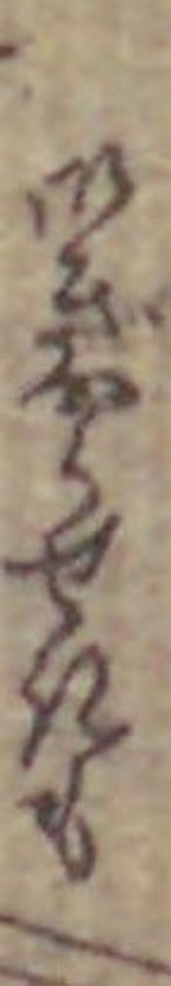御きやうせきも
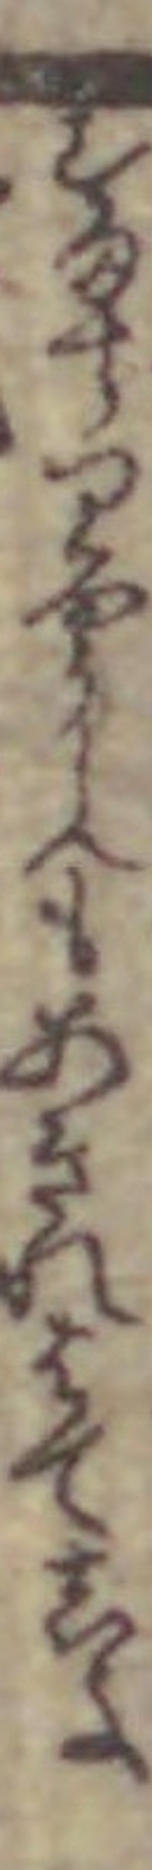すますりやうしんもあきれはてしに
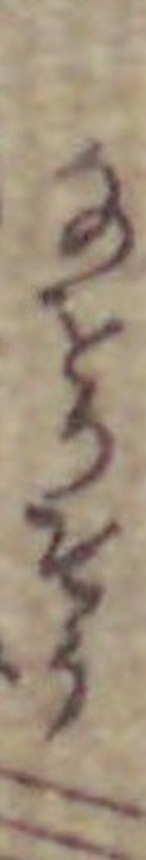なをりそう
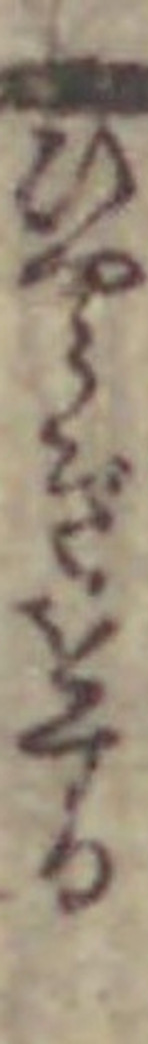ひやうぎをする
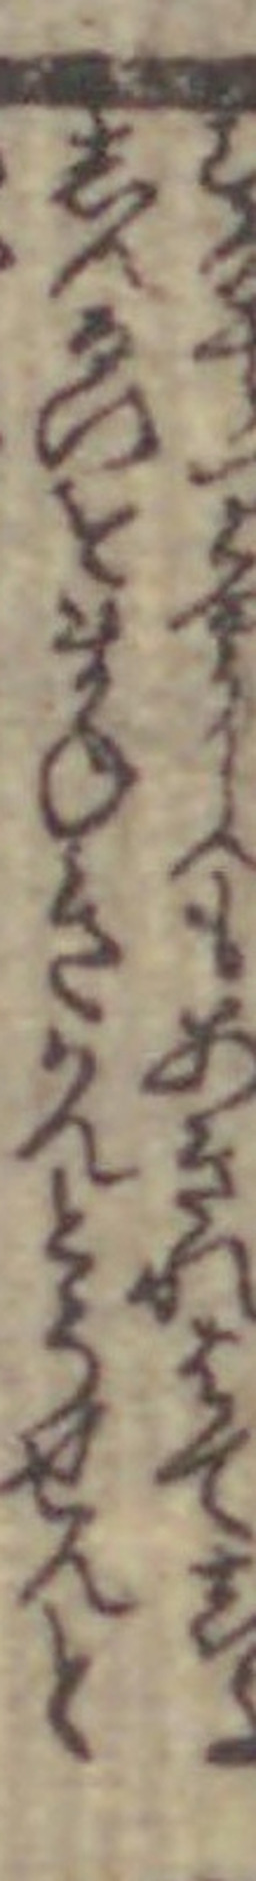しんるいをまねきかんとうせんと
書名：止而道致虚録 3巻
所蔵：国立国会図書館 National Diet Library, JAPAN
